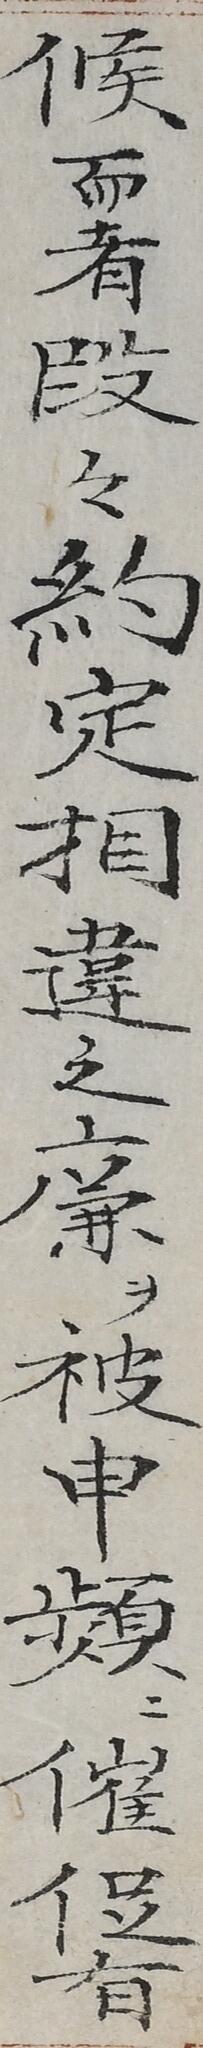候而者段々約定相違之廉ヲ被申頻ニ催促有
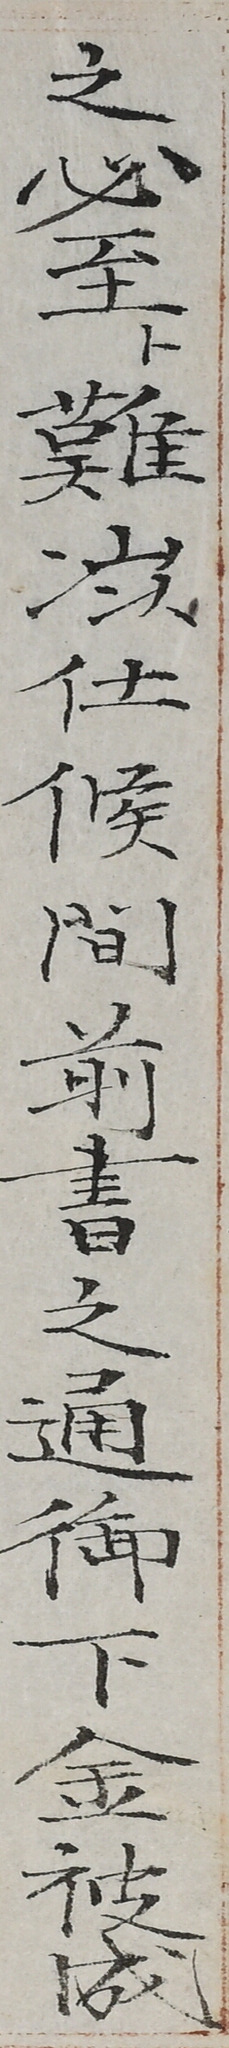之必至ト難渋仕候間前書之通御下金被成
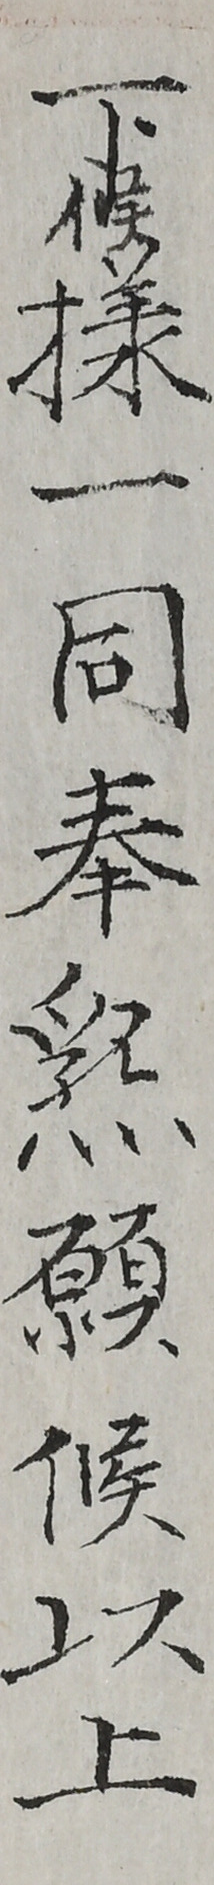下候様一同奉懇願候以上
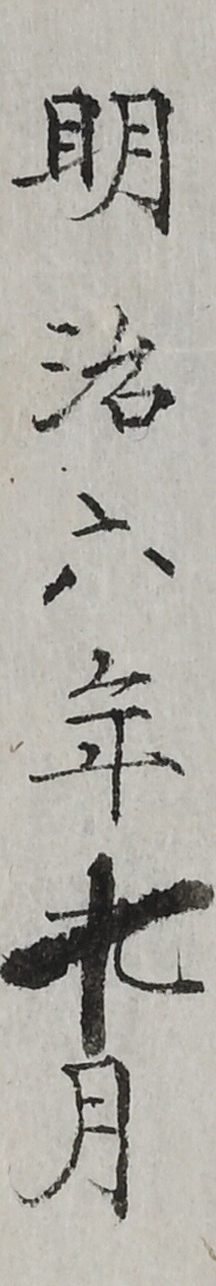明治六年十月
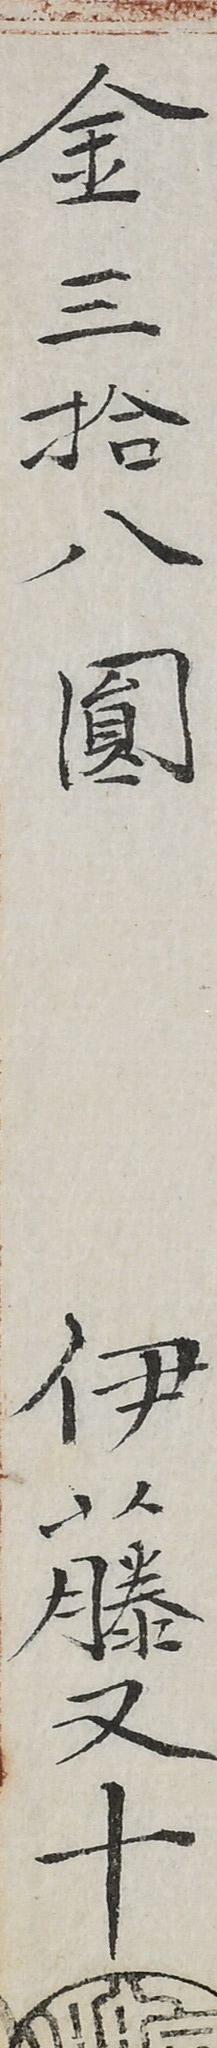金三拾八円伊藤又十
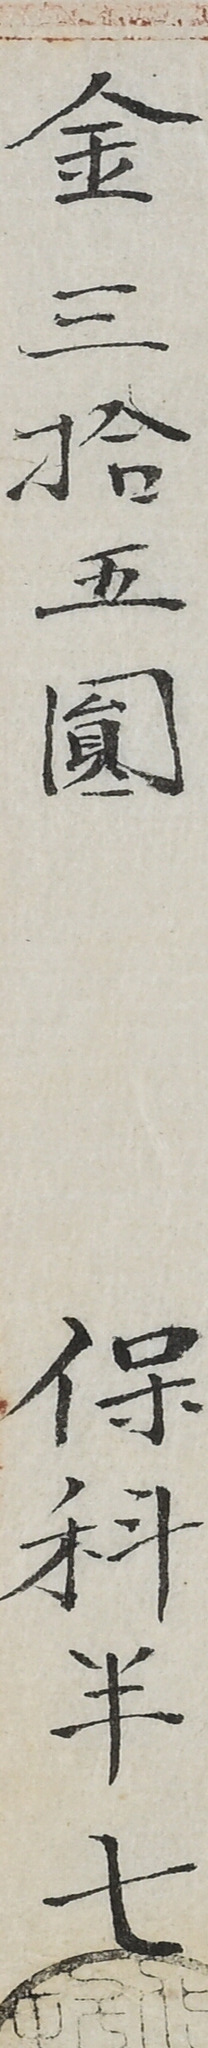金三拾五円保科半七

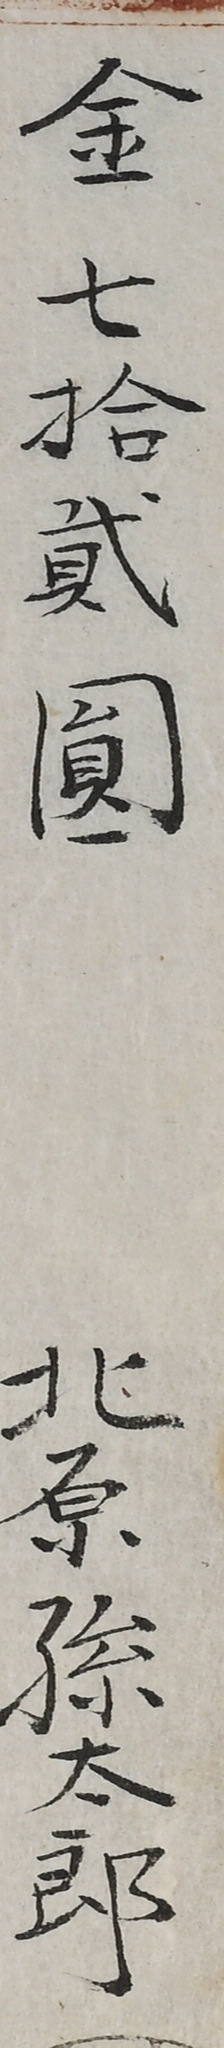金七拾貮円北原孫太郎
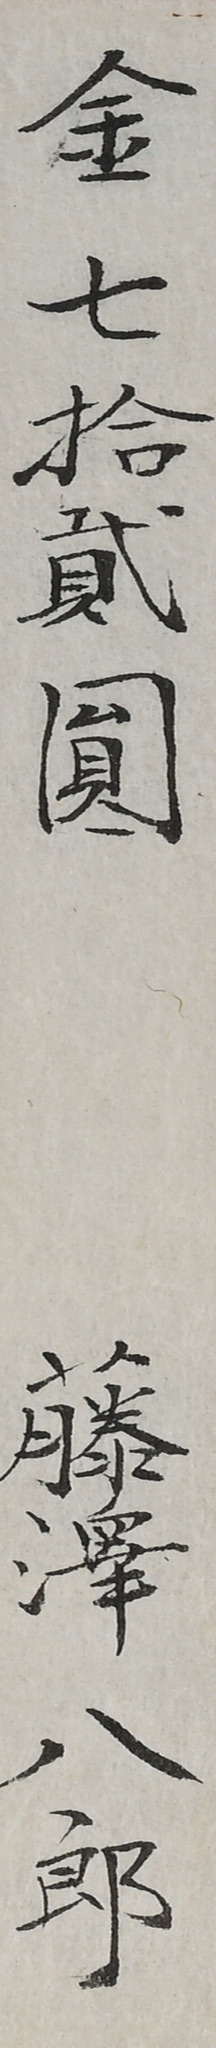金七拾貮円藤澤八郎

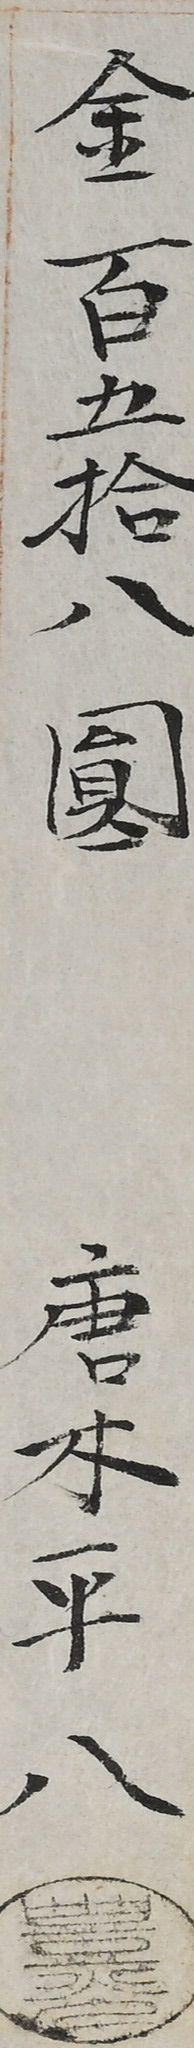金百五拾八円唐木平八
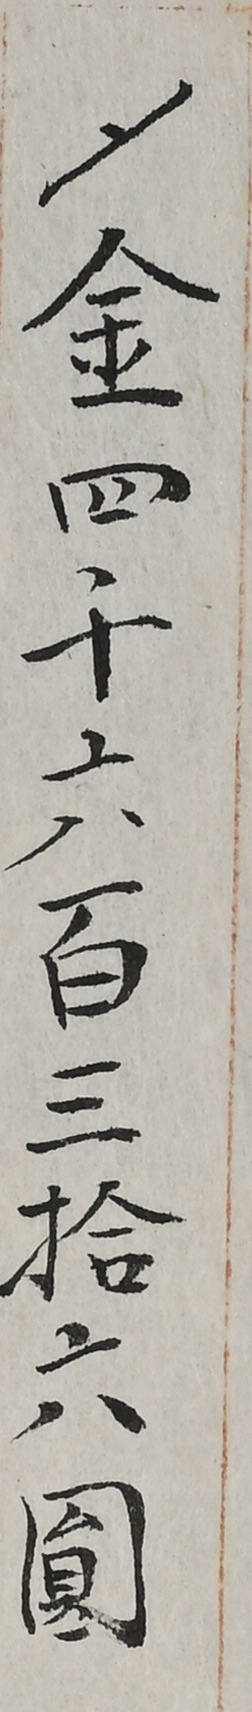〆金四千六百三拾六円
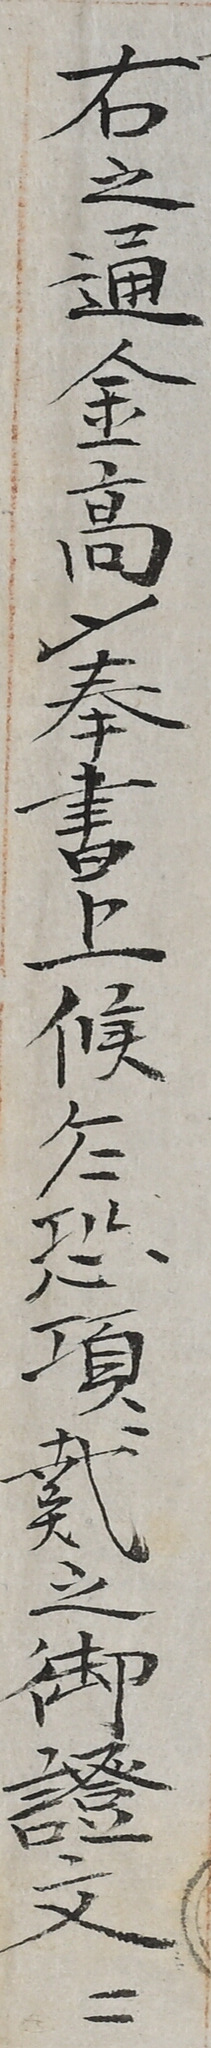右之通金高〆奉書上候乍恐項戴之御証文ニ
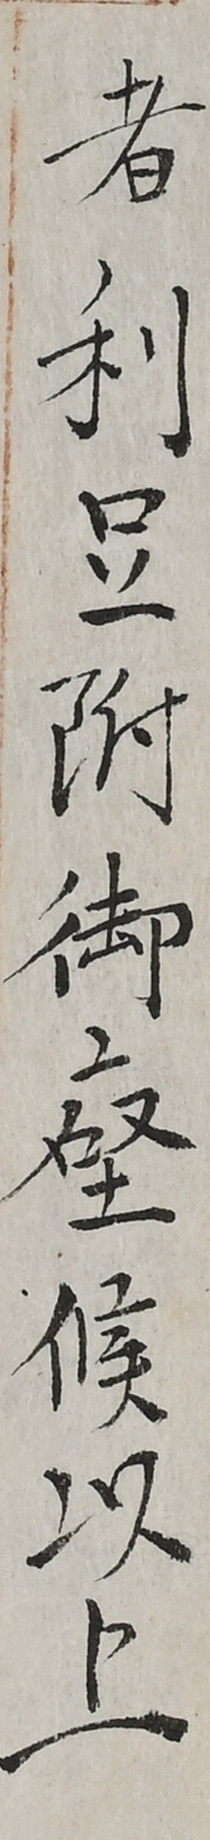者利息付御座候以上
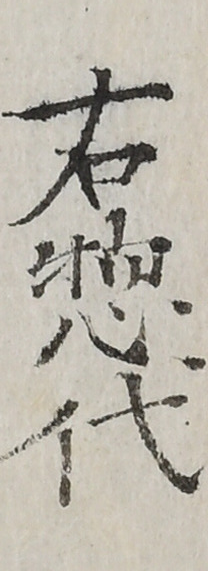右惣代
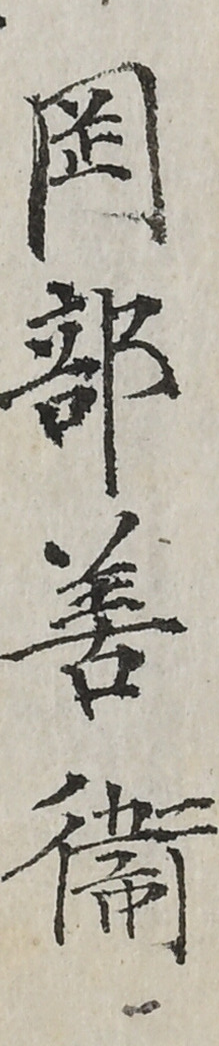岡部善衛
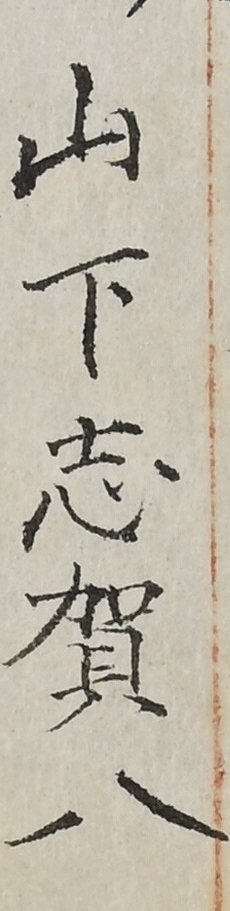山下志賀八
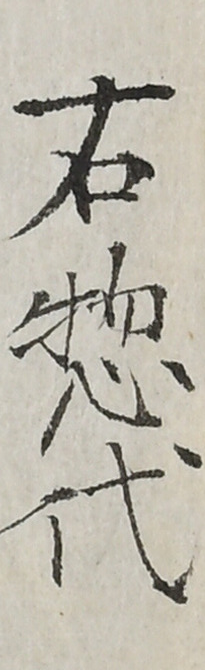右惣代
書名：乍恐以書付奉願上候
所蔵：伊那市立高遠町図書館・合同会社AMANE
